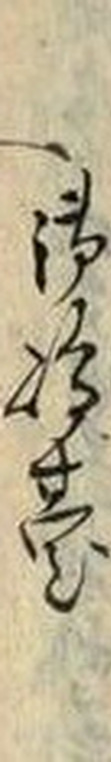御嶋台
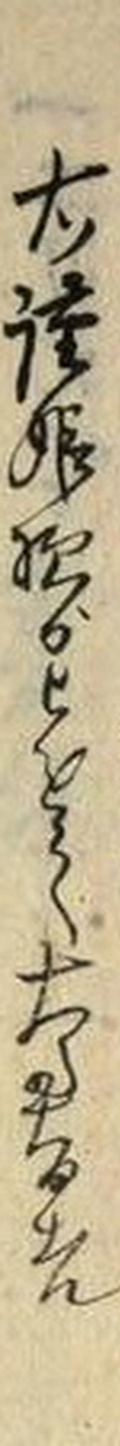右謹姫様ゟ被進之大奥ゟ出ㇽ
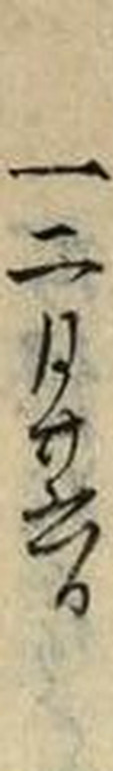一二月廿六日
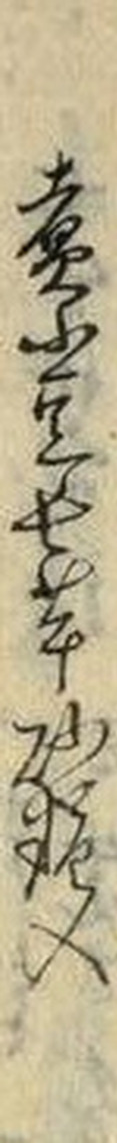煮小豆長芋砂糖入

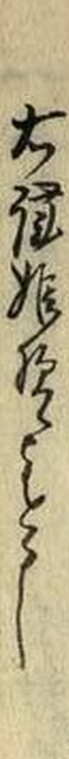右謹姫様へ被進之
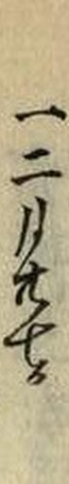一二月廿七日
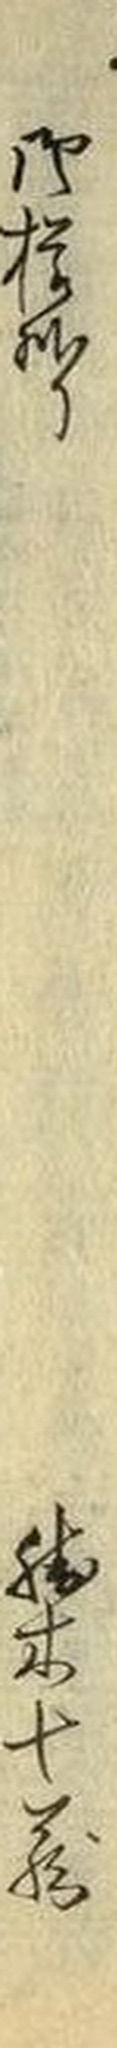御櫛掛り勝木十蔵
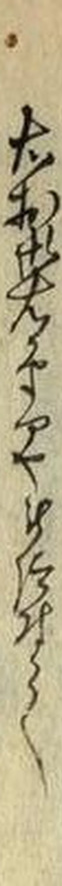右於御右筆部や被仰付之
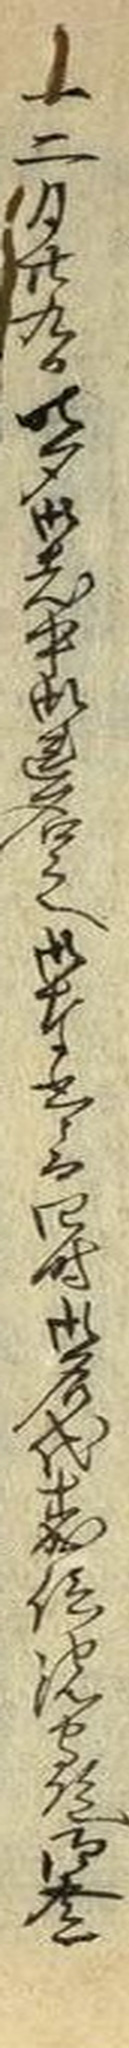一二月廿九日昨夕御老中御連名之御奉書ニ而四時御名代森信濃守殿御登
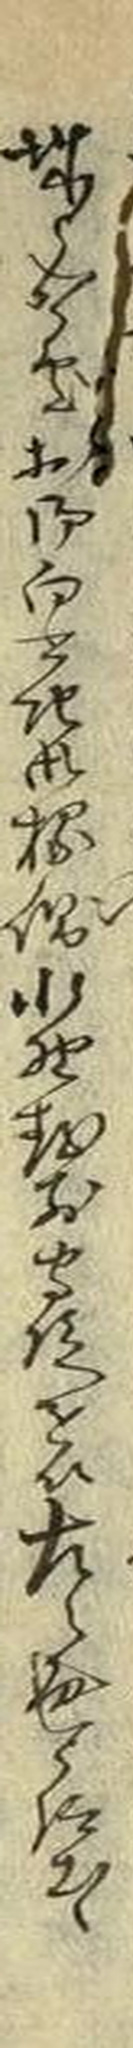城被成候処於御白書院御椽側水野越前守殿を以左之通被仰出之
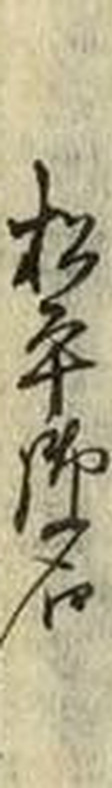松平御名
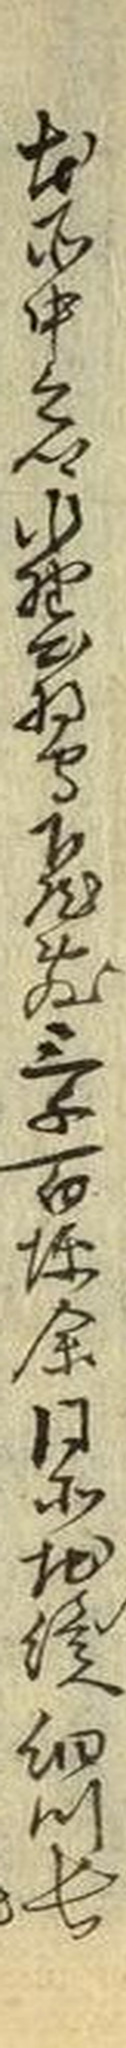本所中之郷水野出羽守下屋敷三千百坪余同所地続細川長
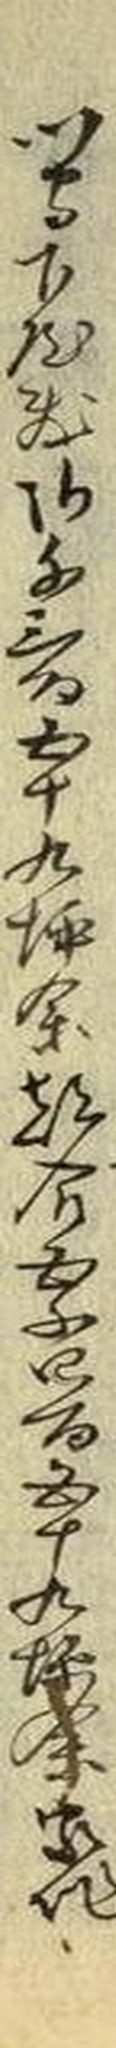門守下屋敷弐千三百五十九坪余都合五千四百五十九坪余家作
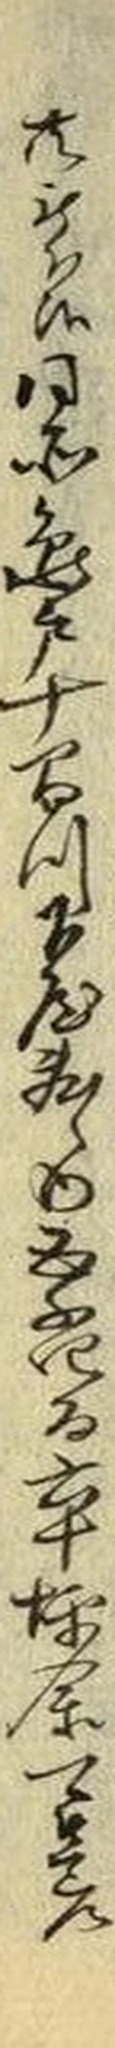共被下候同所亀戸十間川下屋敷之内五千四百六十坪余可被差
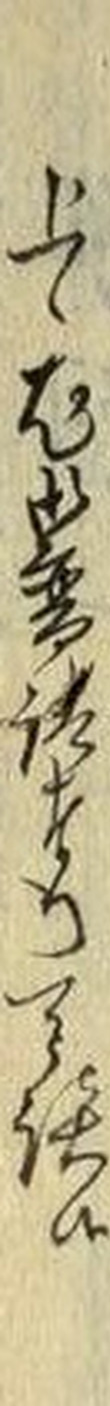上候尤御普請奉行可被談候
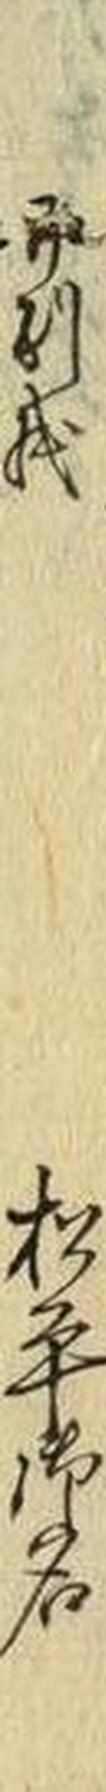御別紙松平御名
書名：少傅日録抄（斉善付側向頭取日記、江戸并道中、初入在国、逝去後…
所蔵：福井県文書館 Fukui Prefectural Archives
